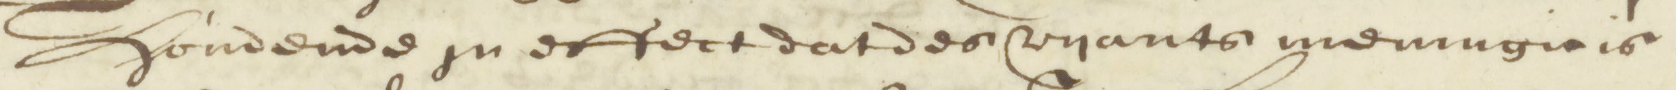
Houdende in effect dat des vyants meninge is
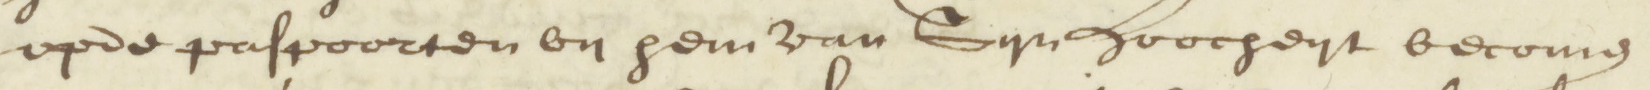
opde paspoorten by hem van Syn Hoocheyt becomen
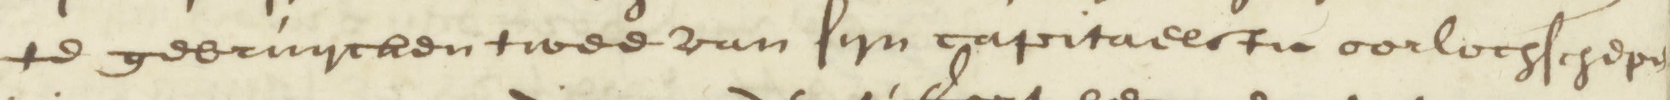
te gebruycken twee van syn capitaelste oorlochschepen
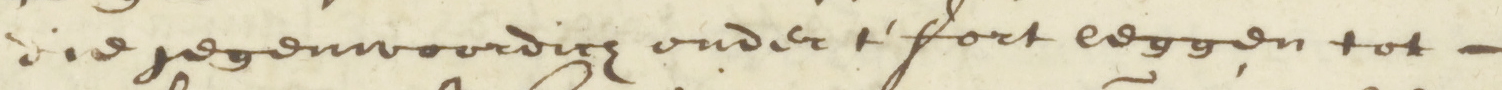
die jegenwoordich onder t‛Fort leggen tot —
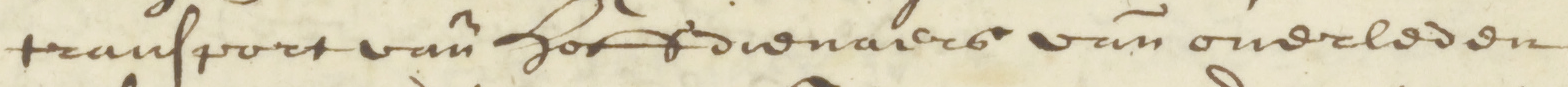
transport van Hoffdienaers van overleden
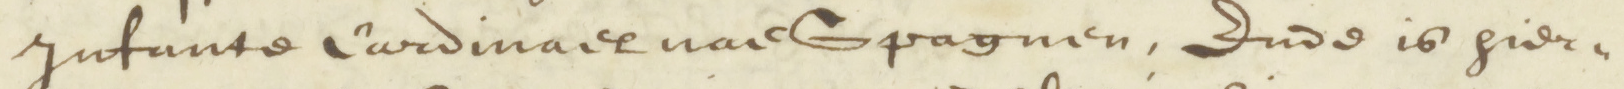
Infante Cardinael nae Spagnen. Ende is hier„
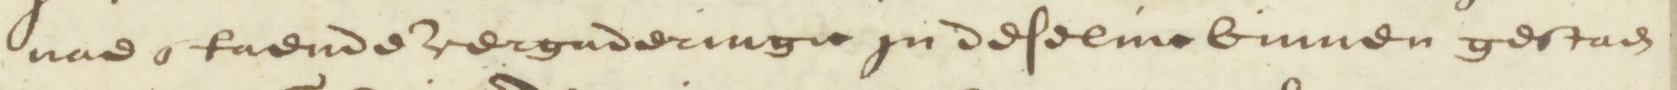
nae staende vergaderinge in deselve binnen gestaen
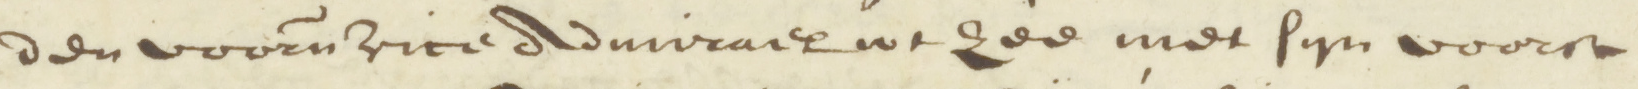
den voorn vice Admirael uut Zee met syn voorsz
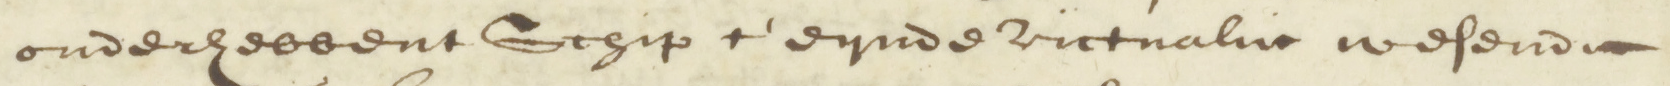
onderhebbent Schip t‛eynde victualie wesende
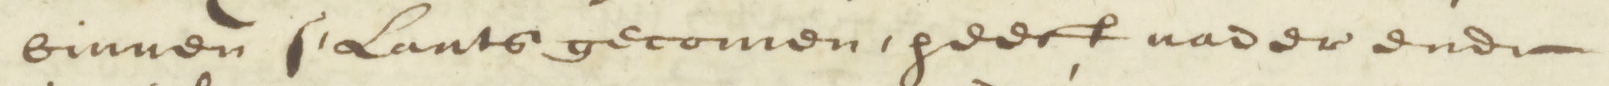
binnen s‛Lants gecomen, heeft nader ende
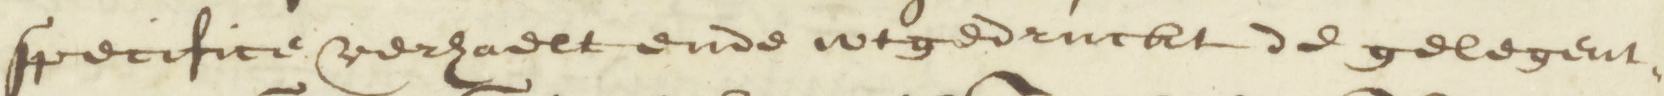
specifice verhaelt ende uutgedruckt de gelegent„
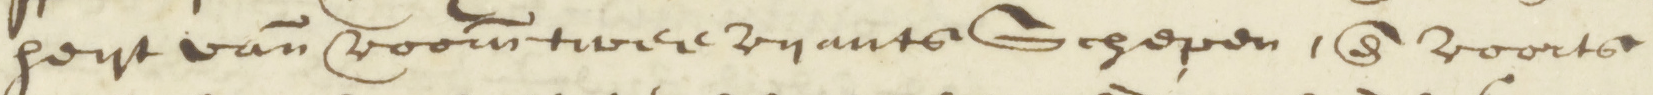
heyt van voorn twee vyants Schepen, en voorts
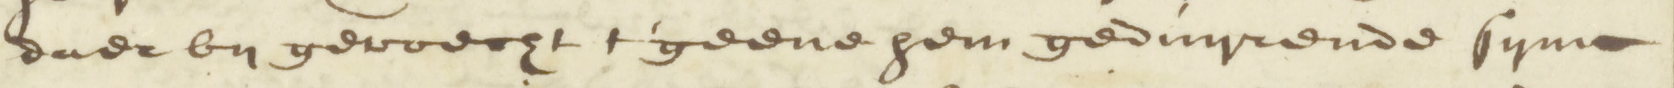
daer by gevoecht t‛geene hem geduyrende syne
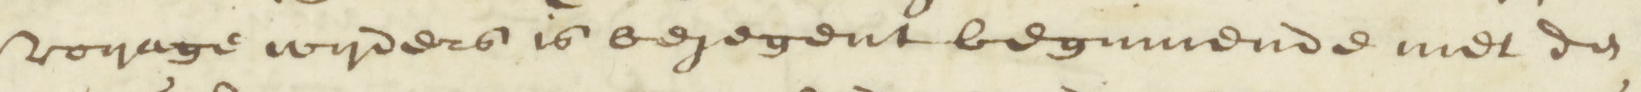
voyage wyders is bejegent beginnende met den
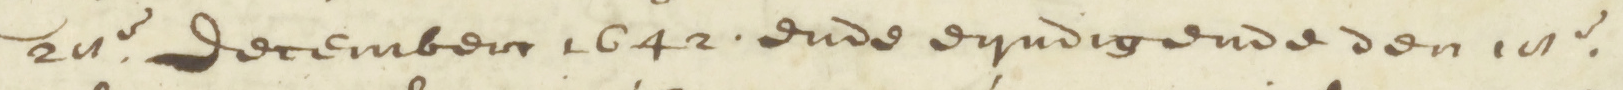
24e December 1642. ende eyndigende den 18e
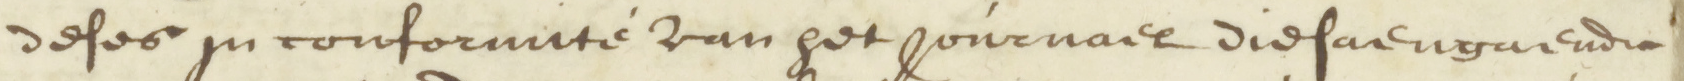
deses in conformité van het journael diesaengaende
